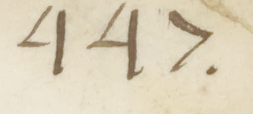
447.
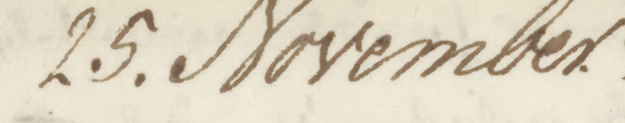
25. November.
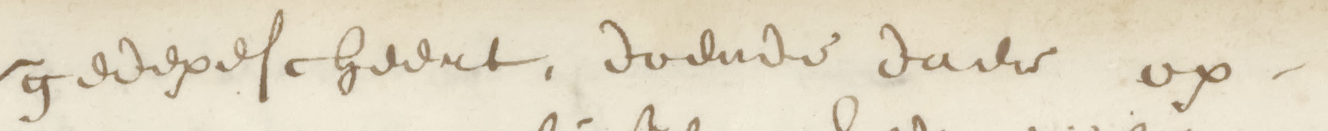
gedepescheert, doende daer op
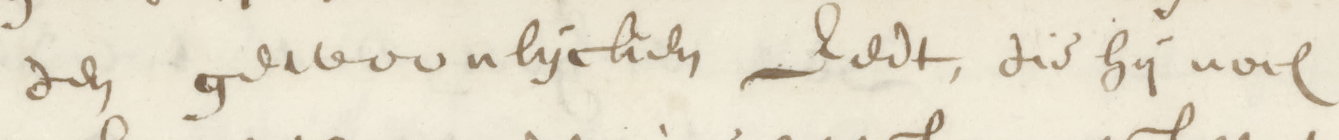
den gewoonlijcken Eedt, die hij noch
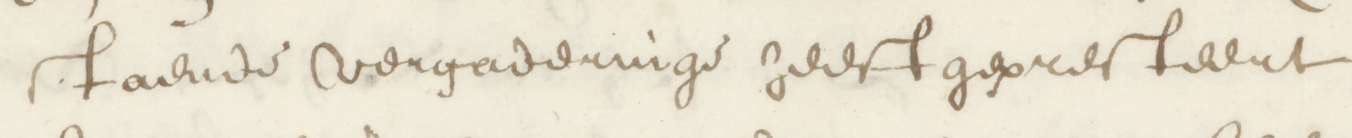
staende vergaderinge heeft gepresteert.
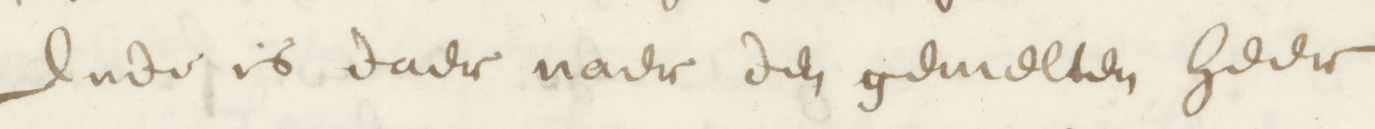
ende is daer naer den gemelten heer
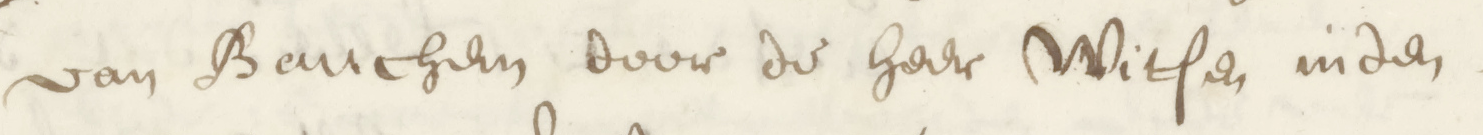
van Banchem door de heer Witsen inden
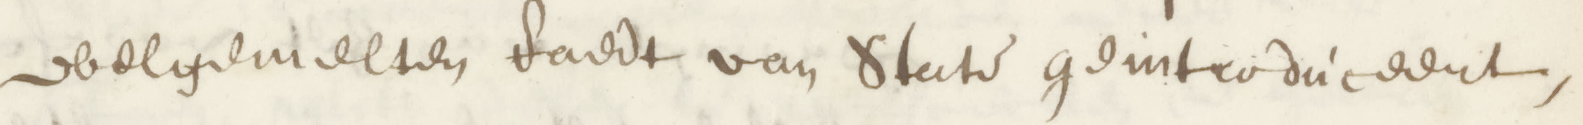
welgemelten Raedt van State geintroduceert.
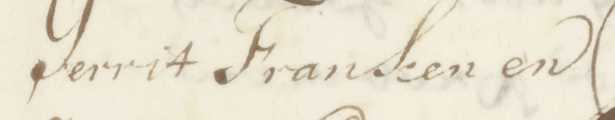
Gerrit Franken en
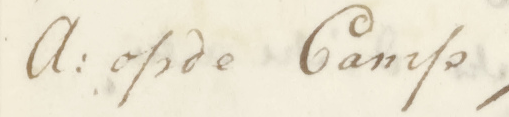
A: opde Camp
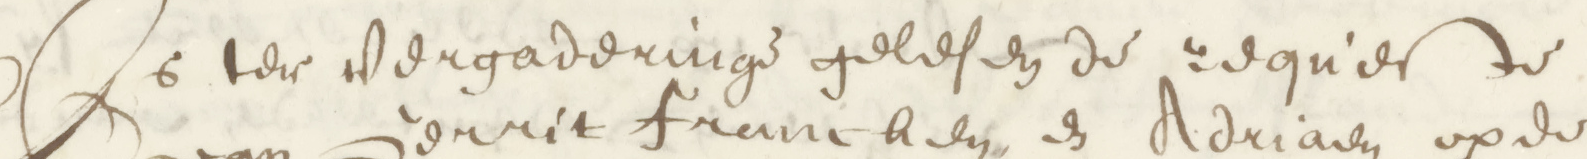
Is ter vergaderinge gelesen de requeste
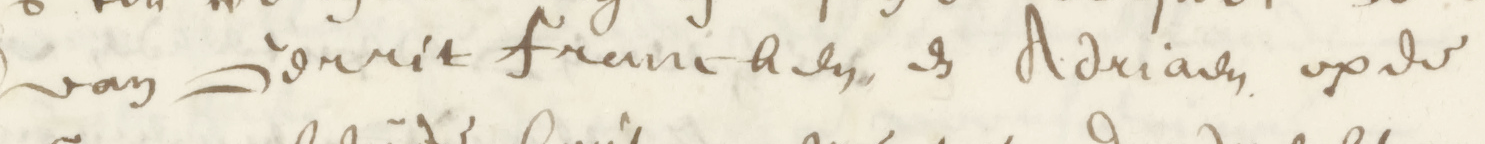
van Gerrit Francken en Adriaen opde
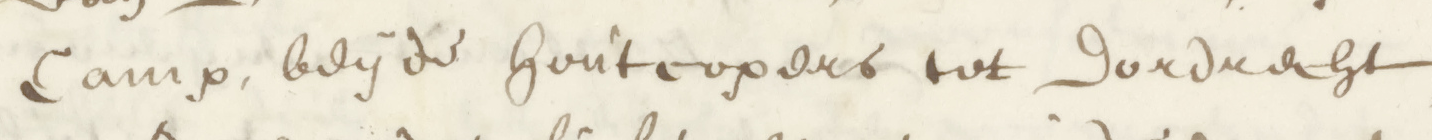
Camp, beijde houtcopers tot Dordrecht
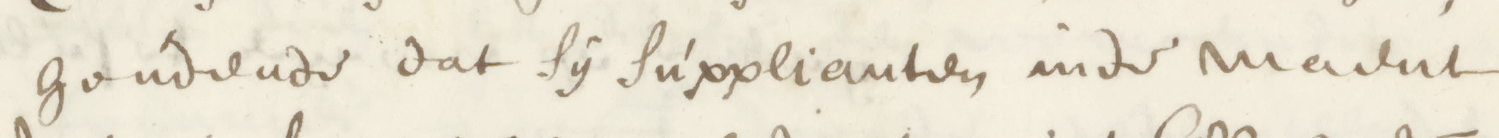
houdende dat sij supplianten inde maent
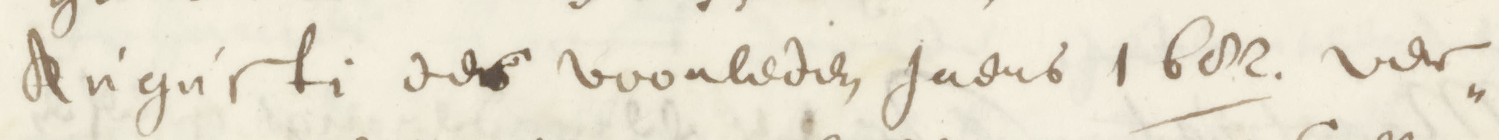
Augusti des voorleden jaers 1682. ver„
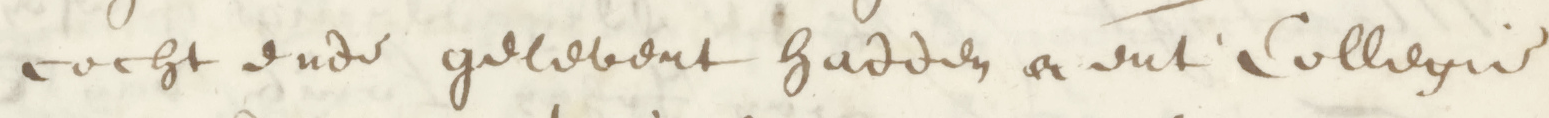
cocht ende gelevert hadden aent Collegie
